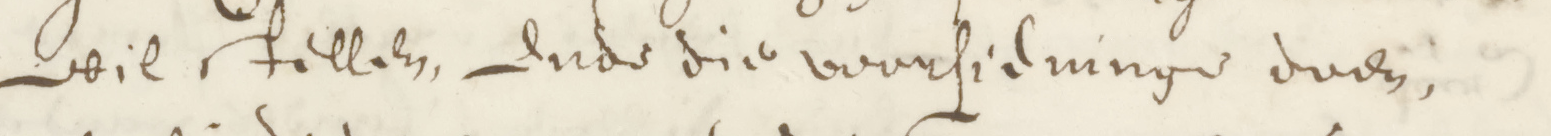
wil stellen, ende die voorsieninge doen,
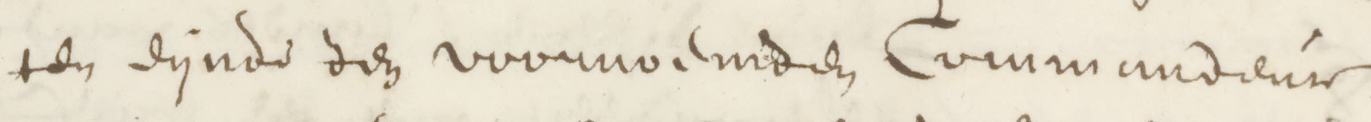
ten eijnde den voornoemden Commandeur
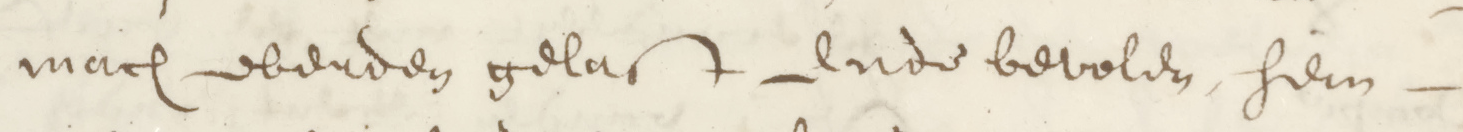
mach werden gelast ende bevolen, hem -
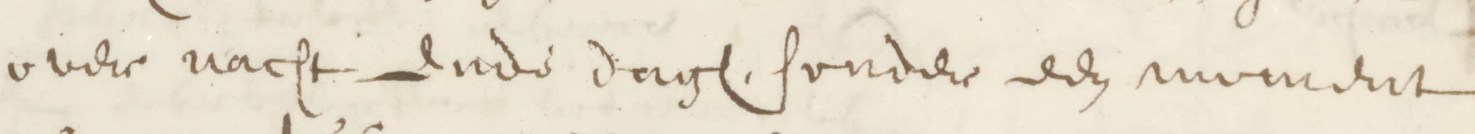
over nacht ende dagh sonder een moment
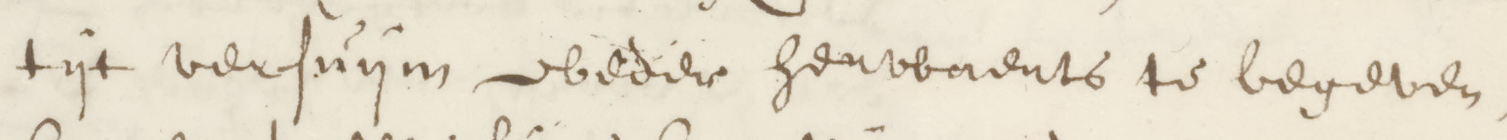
tijt versuijm weder herwaerts te begeven,
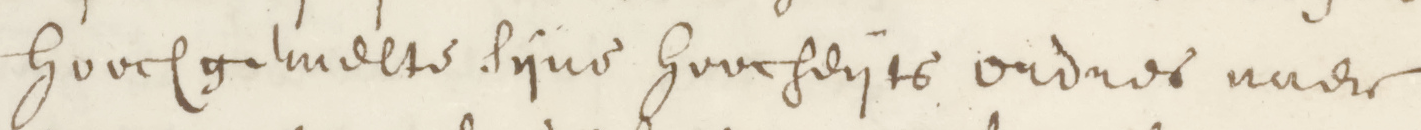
hoochgemelte Sijne hoocheijts ordres naer
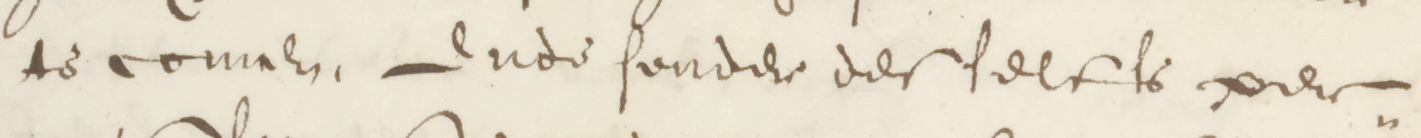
te comen, ende sonder desselffs per„
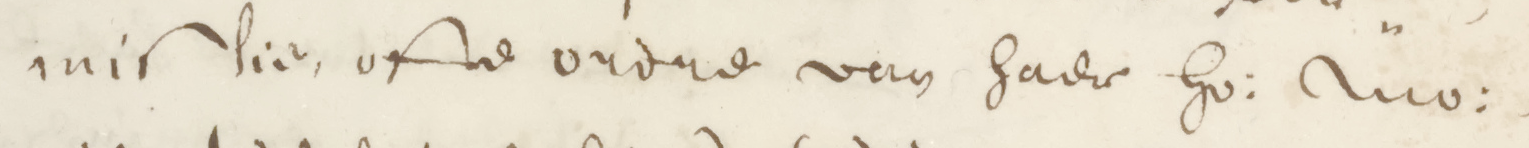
missie, ofte ordre van haer Ho:Mo:
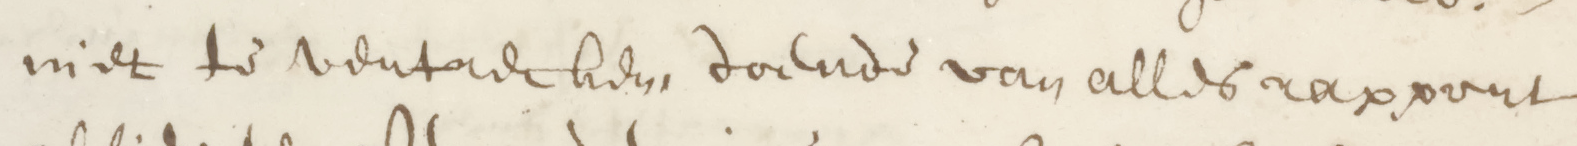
niet te vertrecken, doende van alles rapport
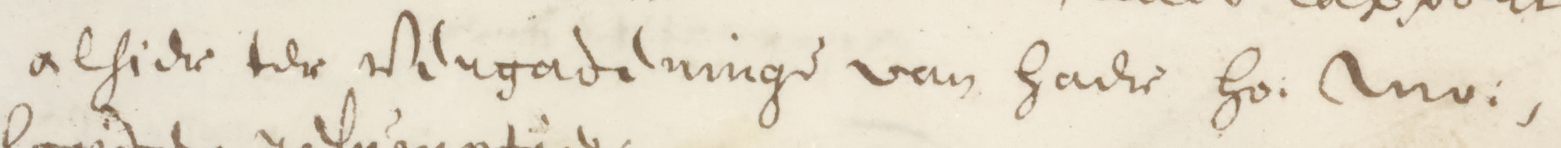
alhier ter Vergaderinge van haer Ho:Mo:,
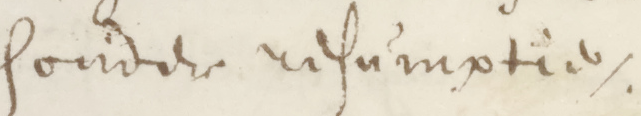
sonder resumptie.
